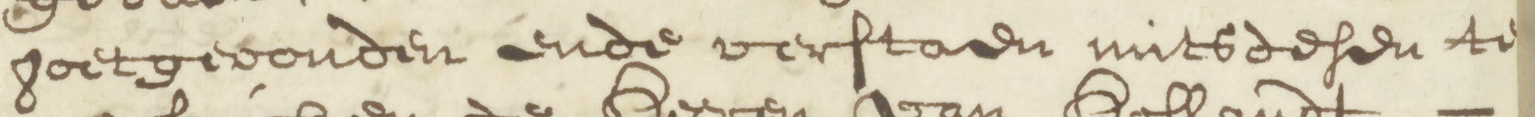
goetgevonden ende verstaen mitsdesen te
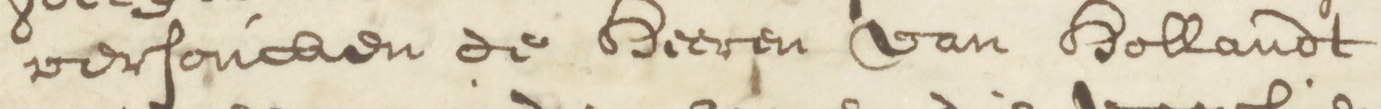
versoucken de Heeren van Hollandt
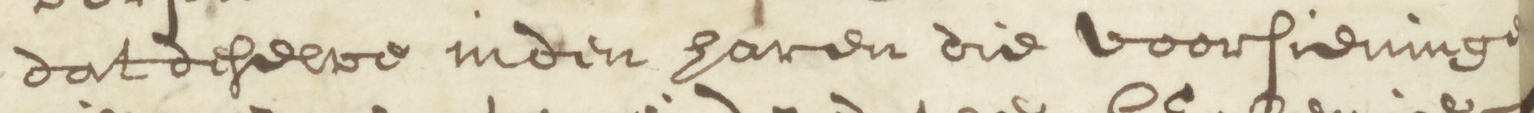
dat deselve inden haren die voorsieninge
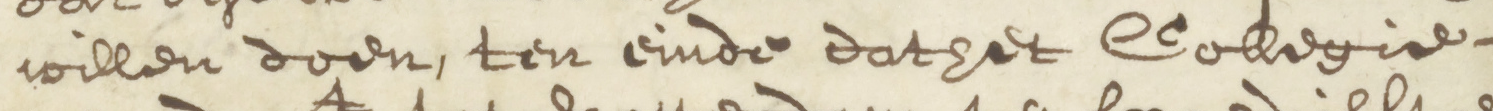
willen doen, ten einde dat het Collegie
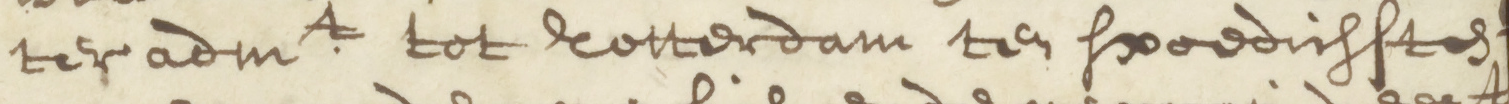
ter admt. tot Rotterdam ten spoedichsten
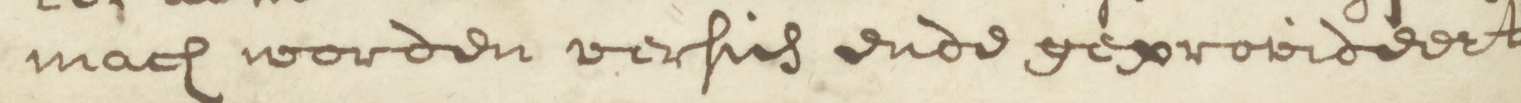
mach worden versien ende geprovideert
